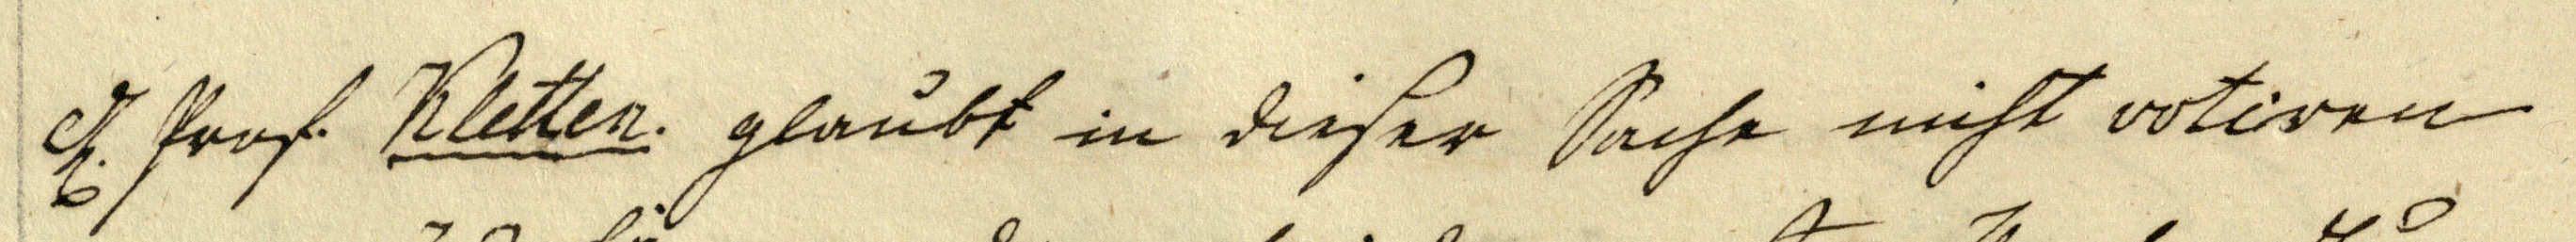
dh. Prof. Kletten. glaubt in dieser Sache nicht votiren
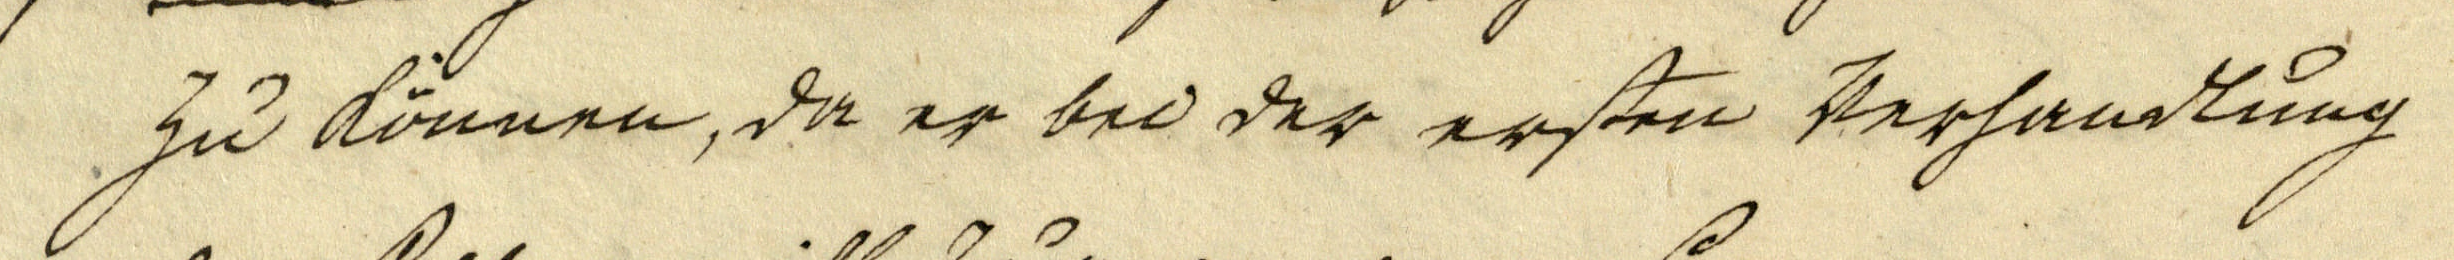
zu können, da er bei der ersten Verhandlung
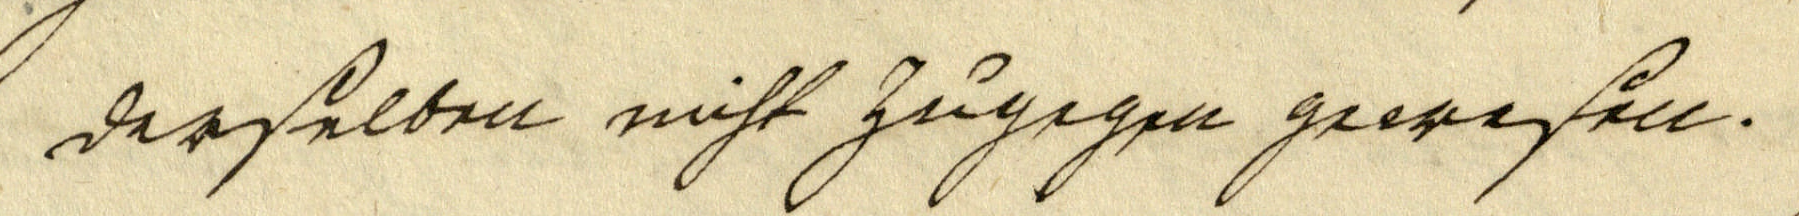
derselben nicht zugegen gewesen.
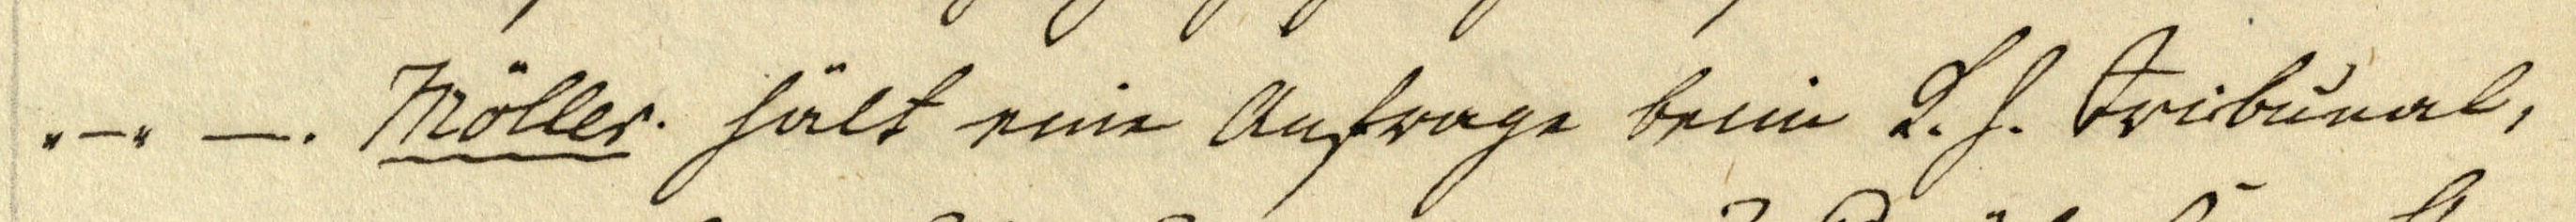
" - " - " Möller. hält eine Anfage beim K. H. Tribunal,
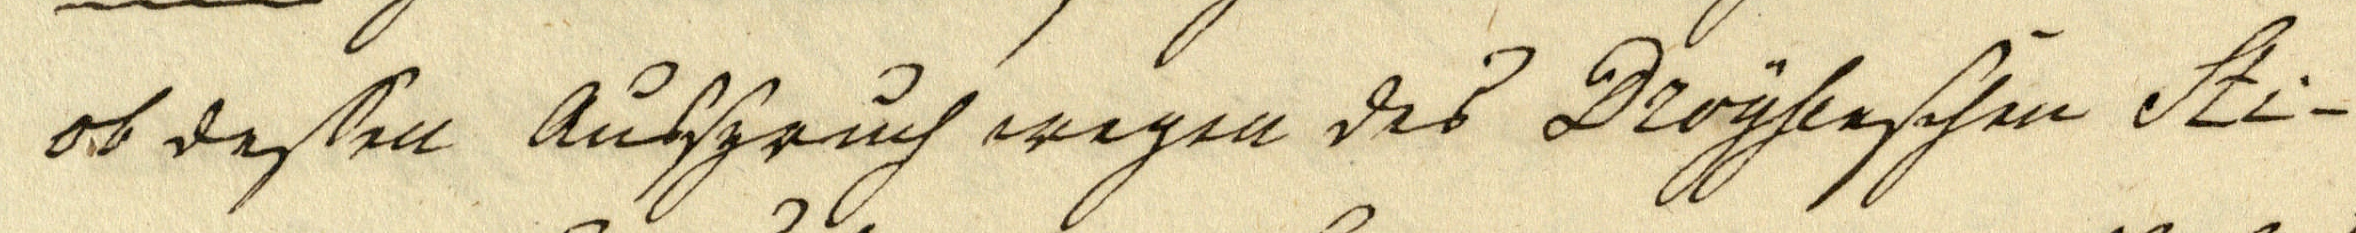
ob dessen Ausspruch wegen des Droysenschen Sti-
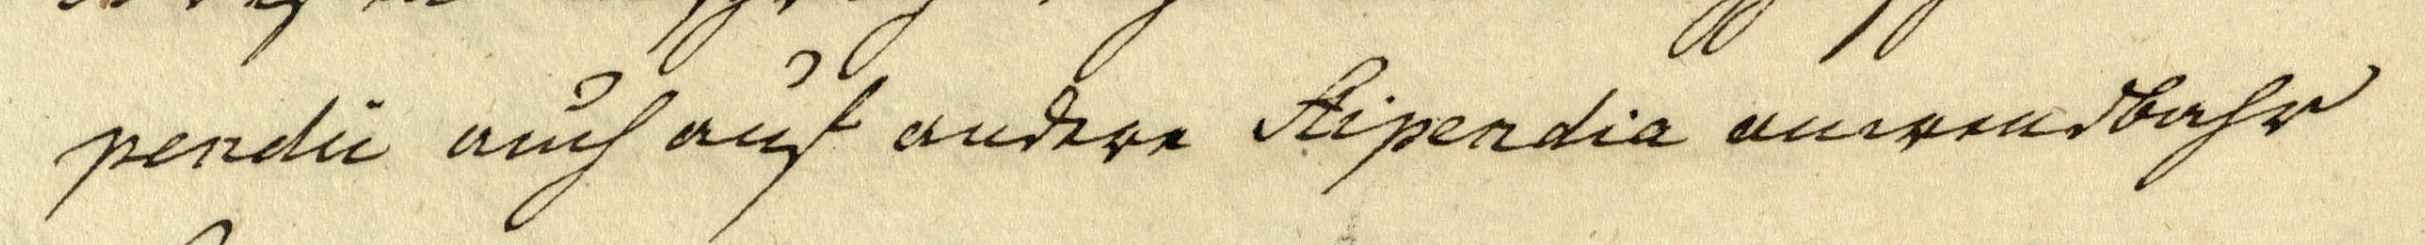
pendii auch auf andere Stipendia anwendbahr
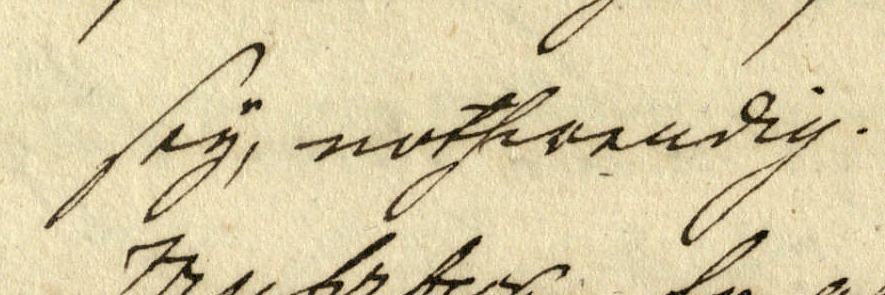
sey, nothwendig.
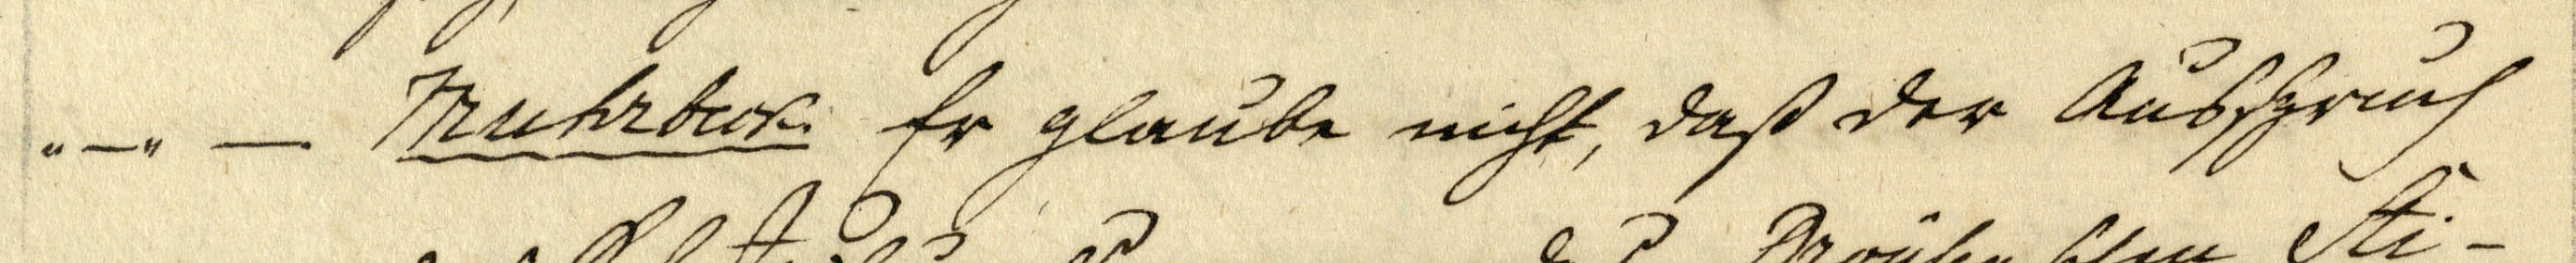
" - " - Murhbeck. Er glaube nicht, daß der Ausspruch
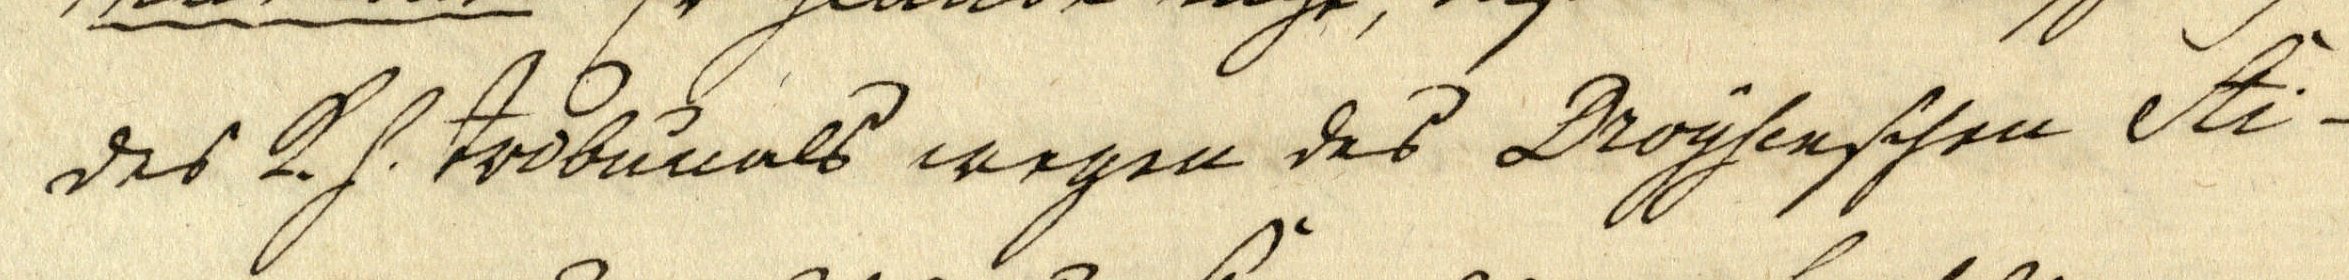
des K. H. Tribunals wegen des Droysenschen Sti-
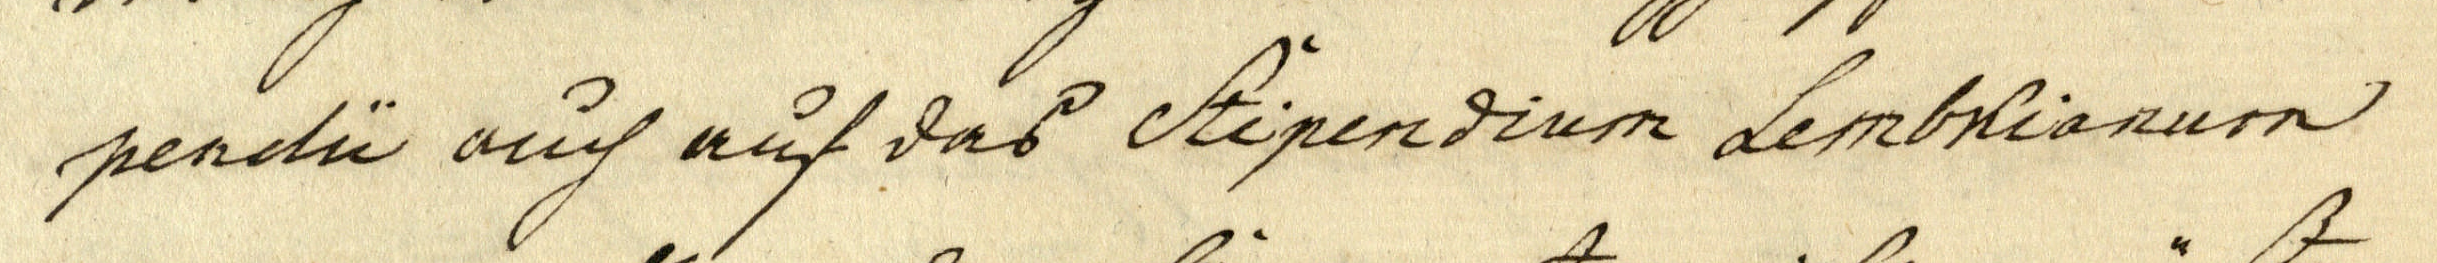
pendii auch auf das Stipendium Lembkianum
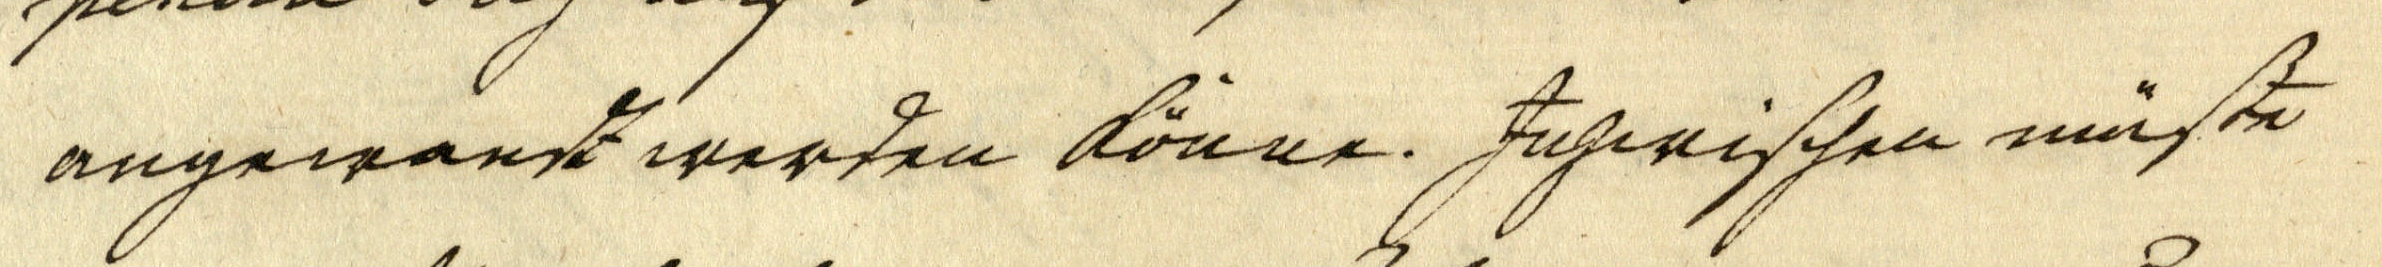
angewandt werden könne. Inzwischen müßte
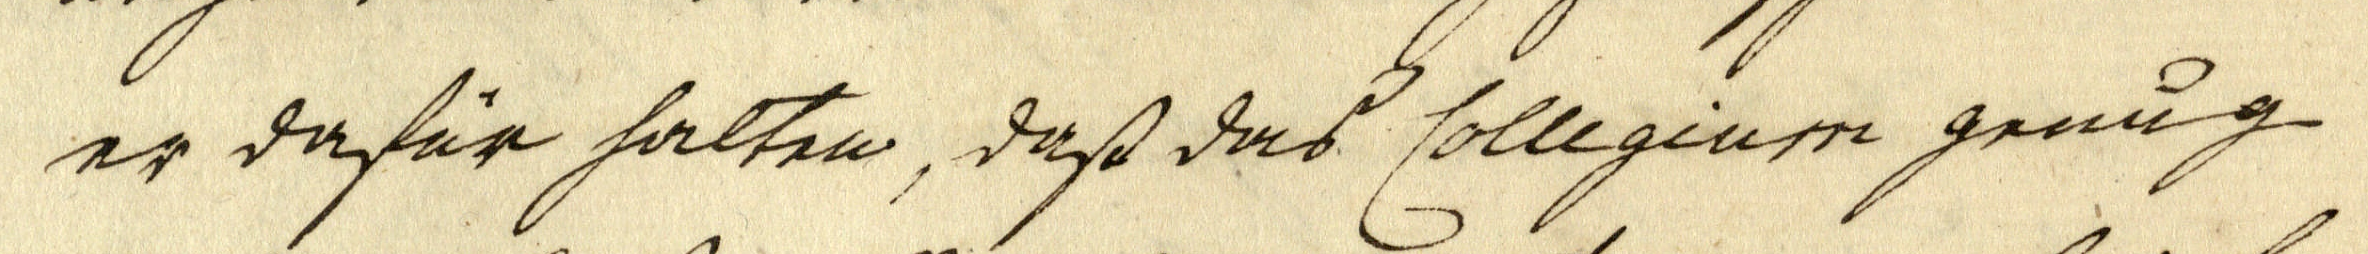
er dafür halten, daß das Collegium genug
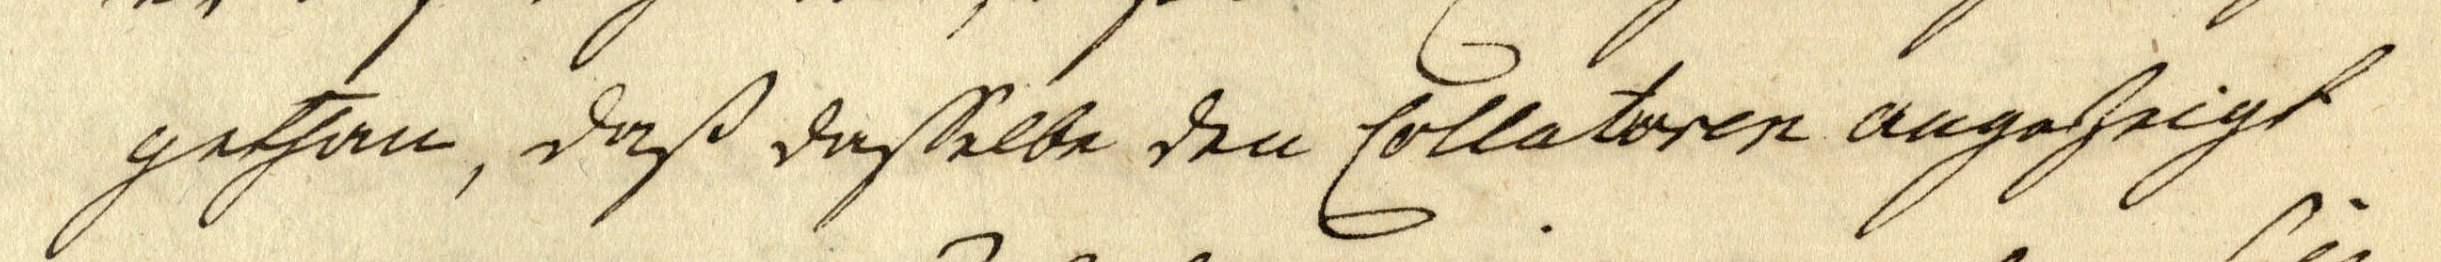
gethan, daß dasselbe den Collatoren angezeigt
